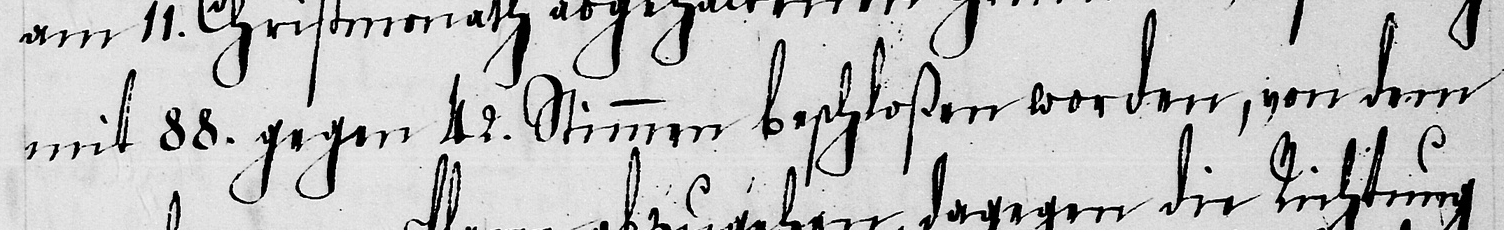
mit 88. gegen 42. Stimmen beschloßen worden, von dem
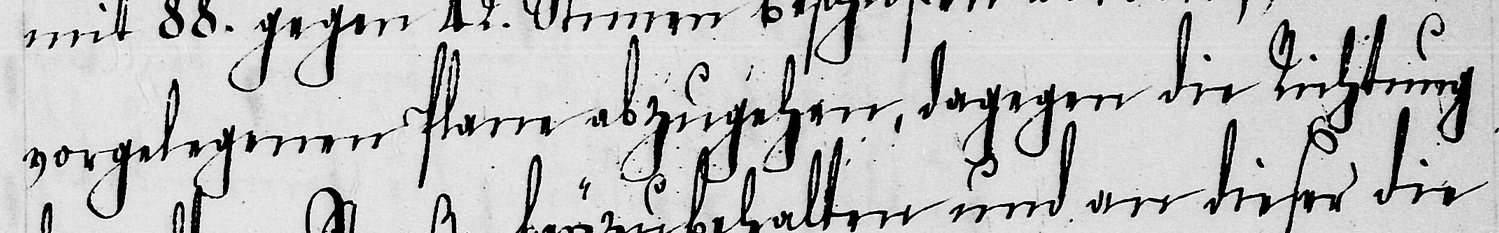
vorgelegenen Plane abzugehen, dagegen die Richtung
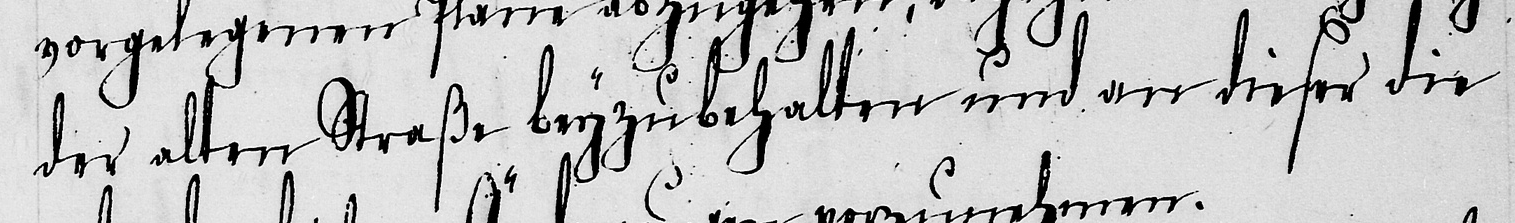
der alten Straße beyzubehalten und an dieser die
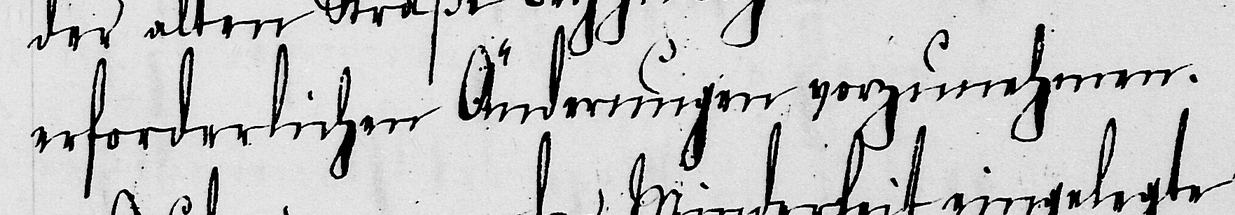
erforderlichen Änderungen vorzunehmen.
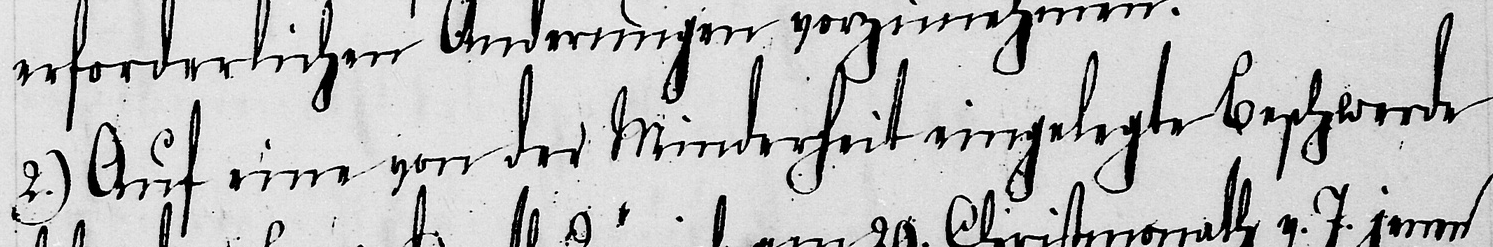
2.) Auf eine von der Minderheit eingelegte Beschwerde
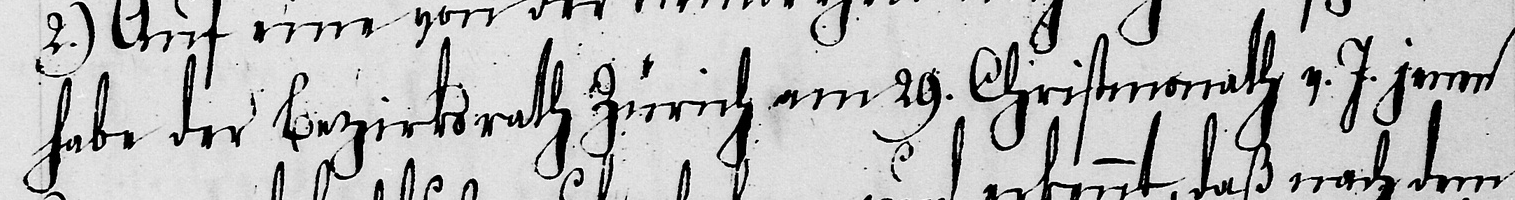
habe der Bezirksrath Zürich am 29. Christmonath v. J. jenen
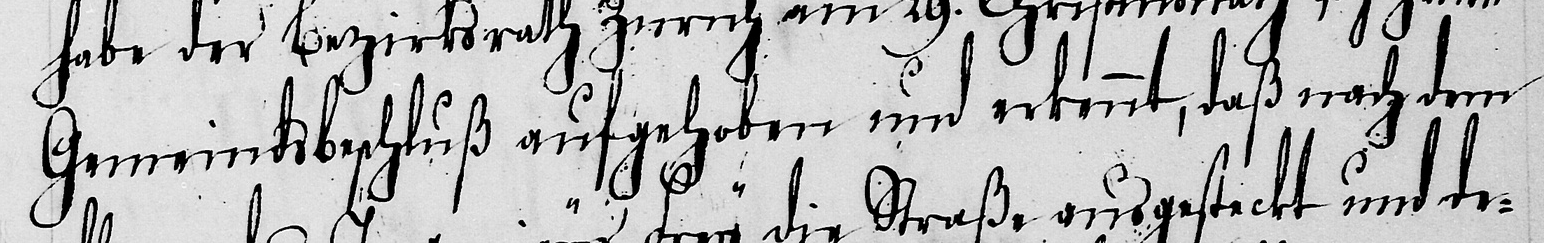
Gemeindsbeschluß aufgehoben und erkennt, daß nach dem
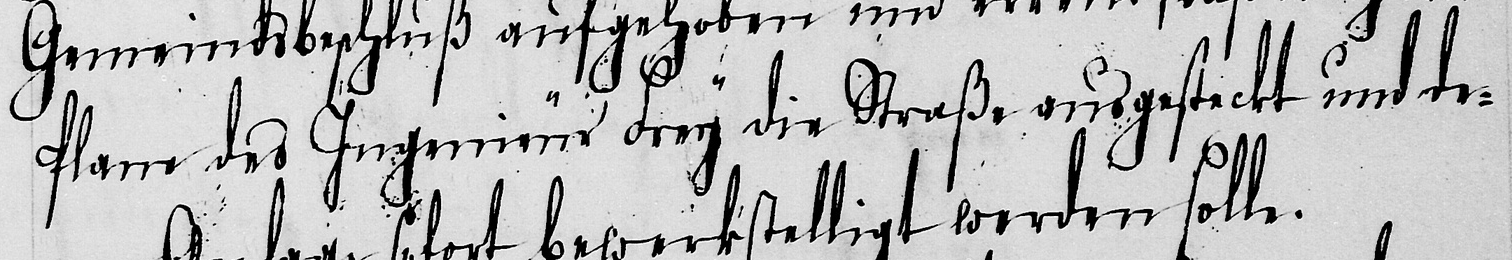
Plane des Ingenieur Frey die Straße ausgesteckt und de¬
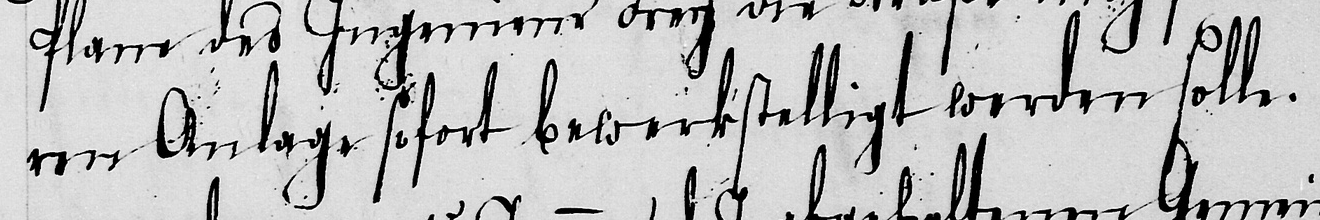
ren Anlage sofort bewerkstelligt werden solle.
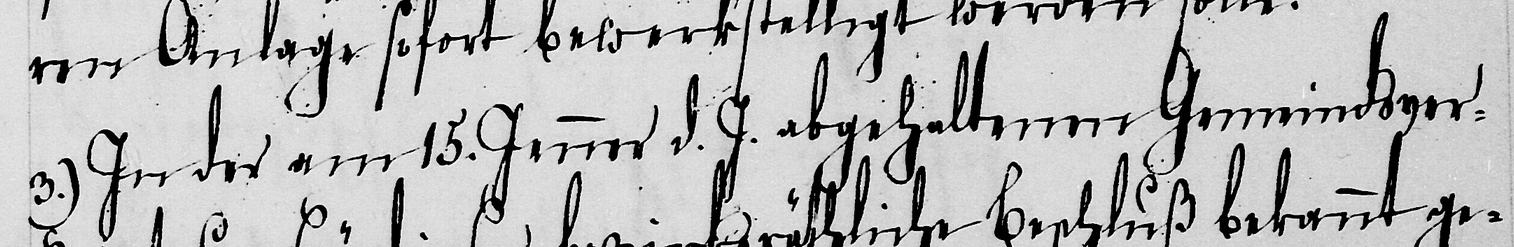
3.) In der am 15. Jenner d. J. abgehaltenen Gemeindsvers¬
